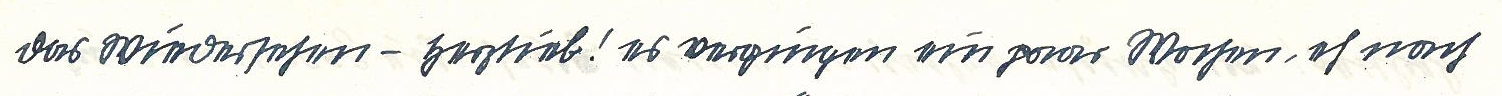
das Wiedersehen – Herzlieb! es vergingen ein paar Wochen, eh nach
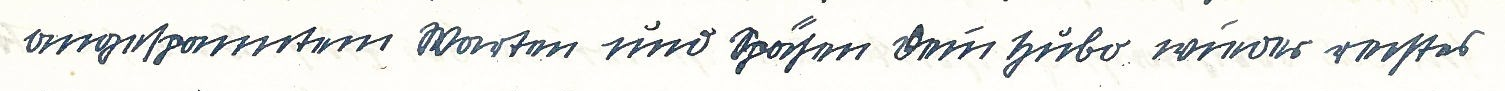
angespanntem Warten und Spähen Dein Hubo wieder rechtes
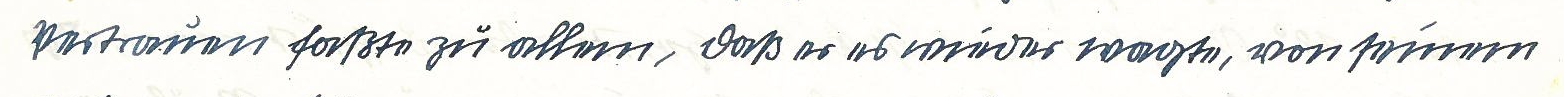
Vertrauen faßte zu allem, daß er es wieder wagte, von seinem
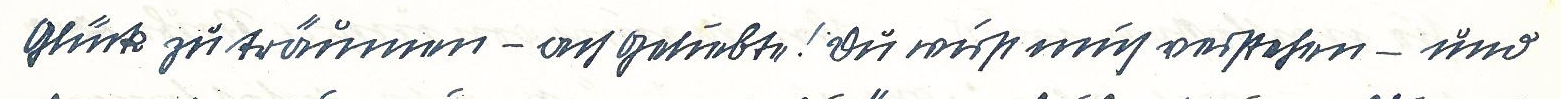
Glück zu träumen – ach Geliebte! Du wirst mich verstehen – und
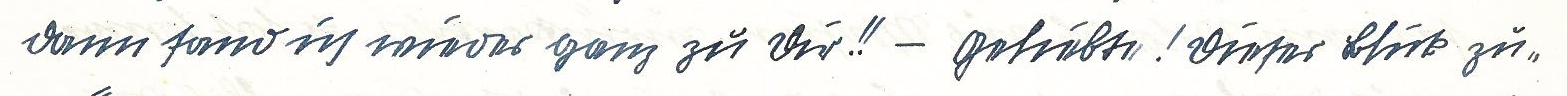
dann fand ich wieder ganz zu Dir!! – Geliebte! Dieser Blick zu¬
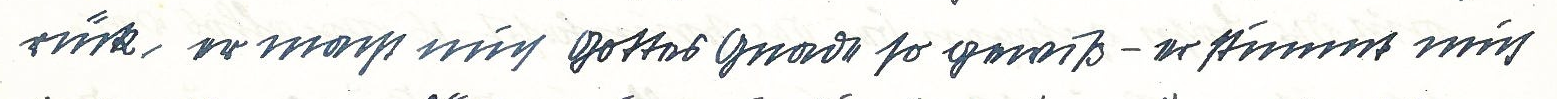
rück, er läßt mich Gottes Gnade so gewiß – er stimmt mich
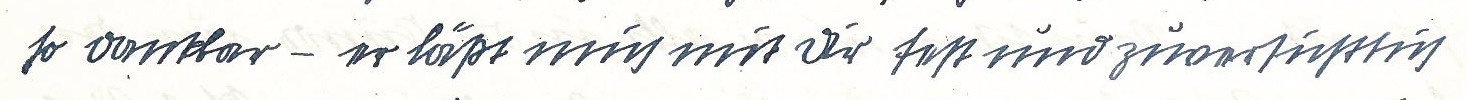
so dankbar – er läßt mich mit Dir fest und zuversichtlich
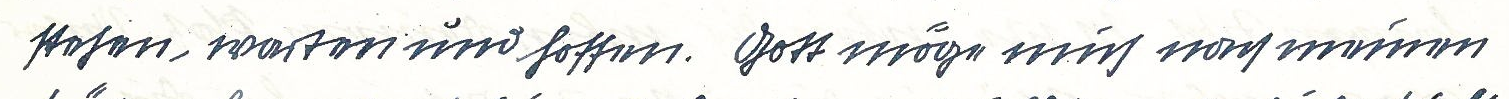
stehen, warten und hoffen. Gott möge mich nach meinen
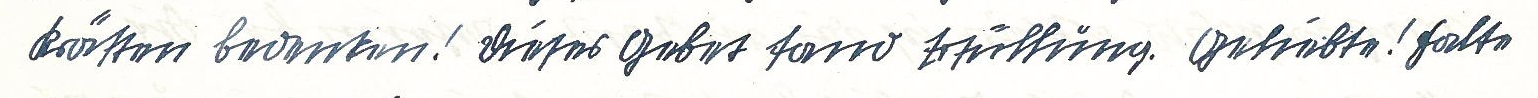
Kräften bedenken! Dieses Gebet fand Erfüllung. Geliebte! Falte
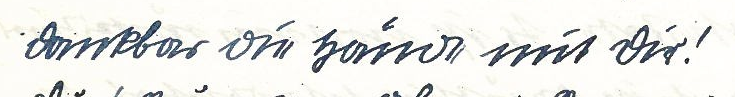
dankbar die Hände mit Dir!
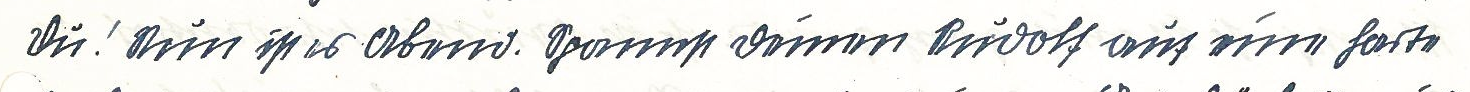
Du! Nun ist es Abend. Spannst Deinen auf eine harte
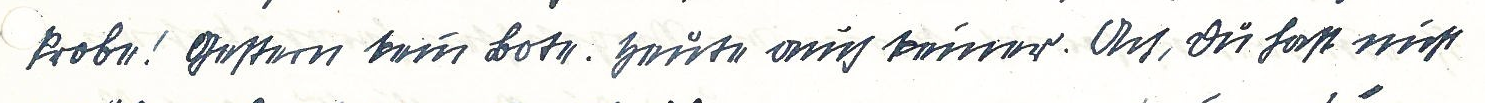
Probe, gestern kein Bote. Heute auch keiner. Ach, Du hast nicht
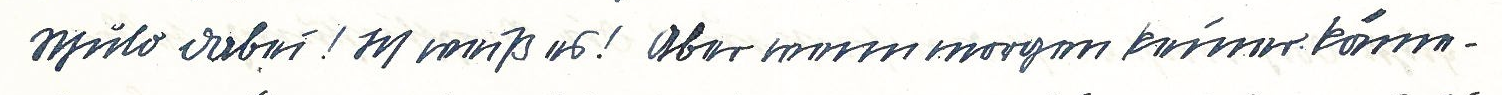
Schuld dabei! Ich weiß es! Aber wenn morgen keiner käme,
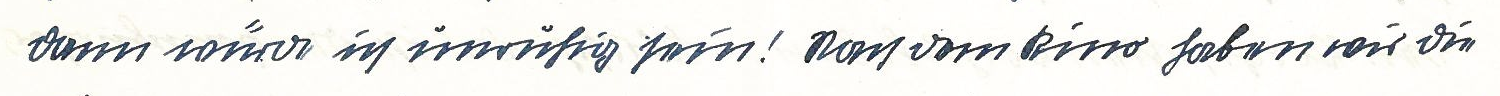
dann würde ich unruhig sein! Nach dem Kino haben wir die
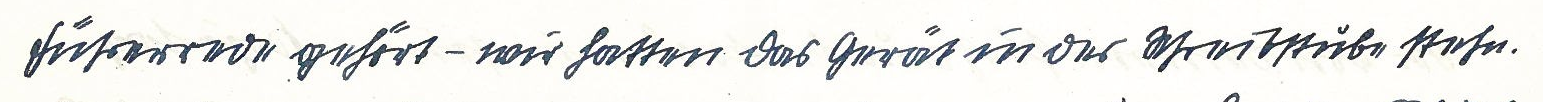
Führerrede gehört – wir hatten das Gerät in der Schreibstube stehn.
